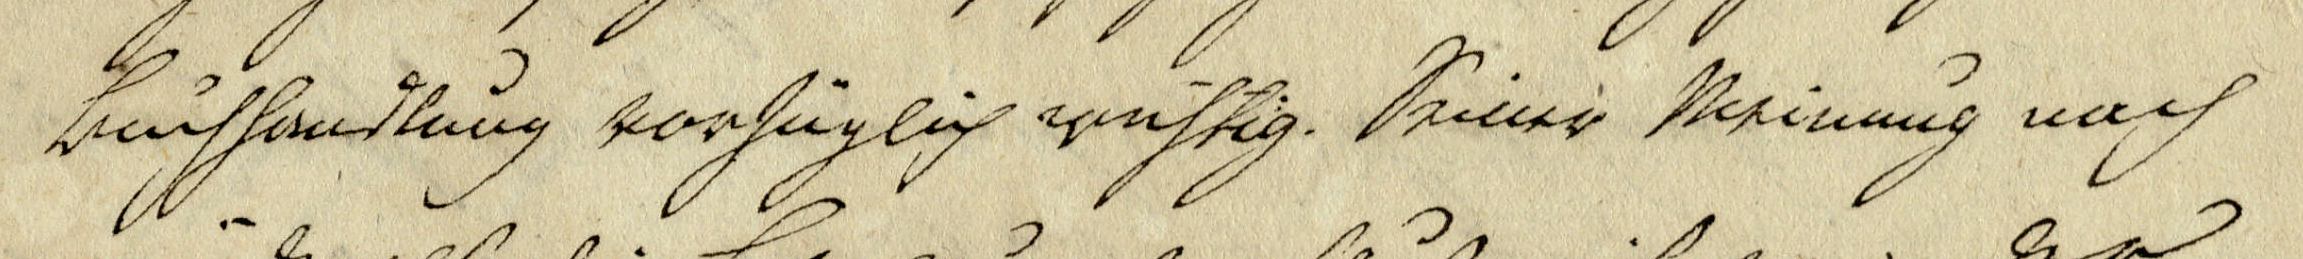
Buchhandlung vorzüglich wichtig. Seiner Meinung nach
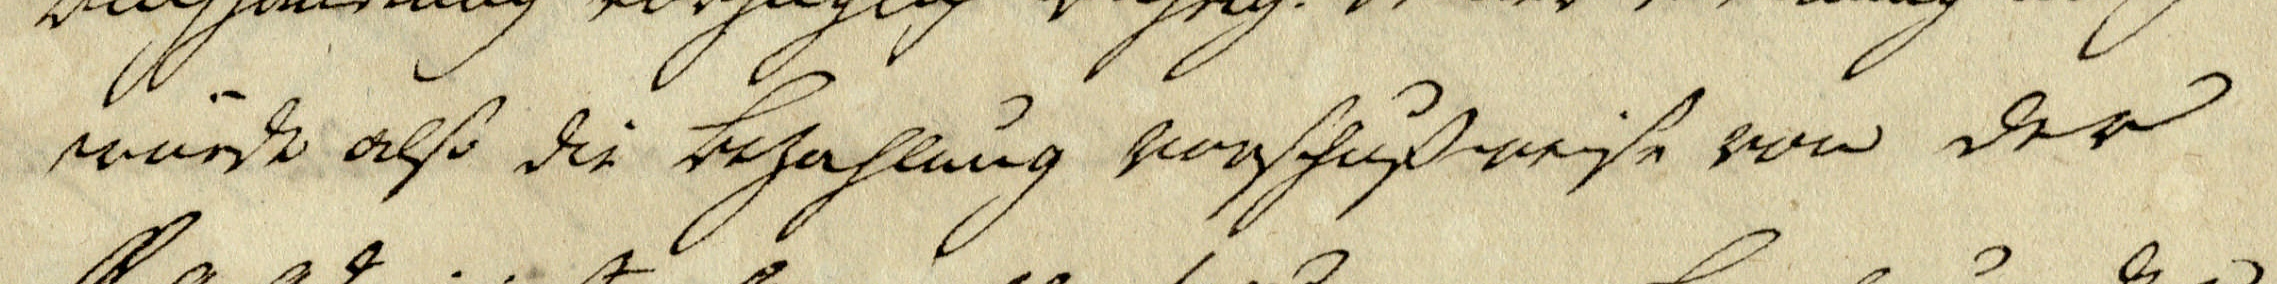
würde also die Bezahlung vorschußweise von der
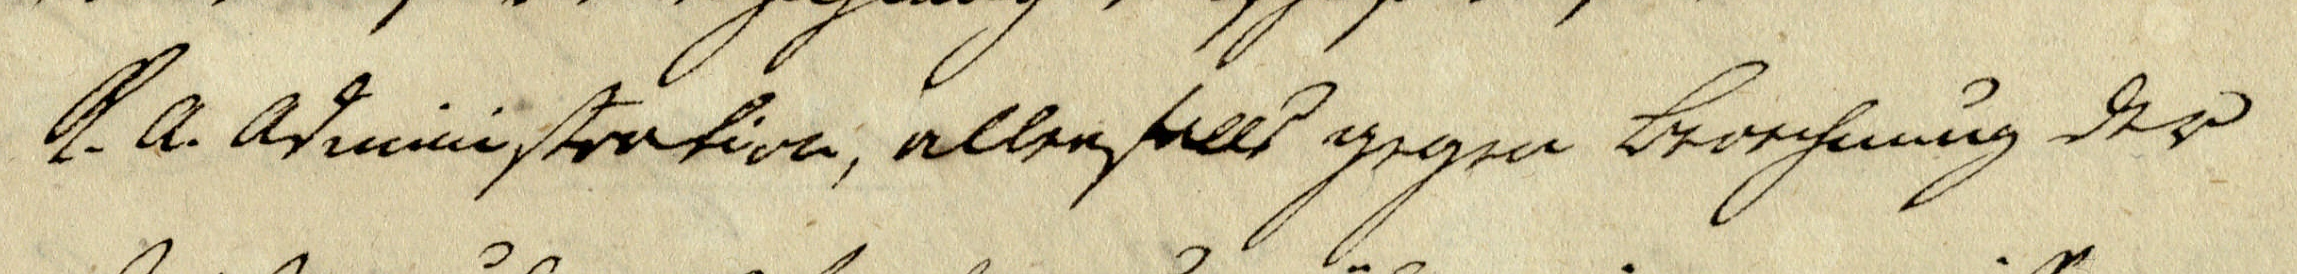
K. A. Administration, allenfalls gegen Berechnung der
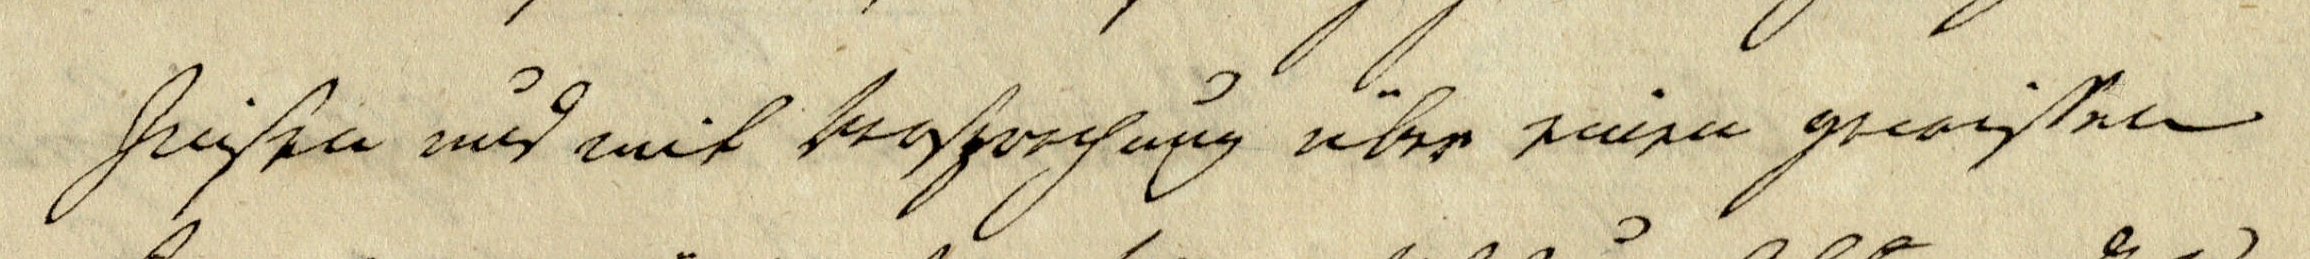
Zinsen und mit Versprechueg über einen gewissen
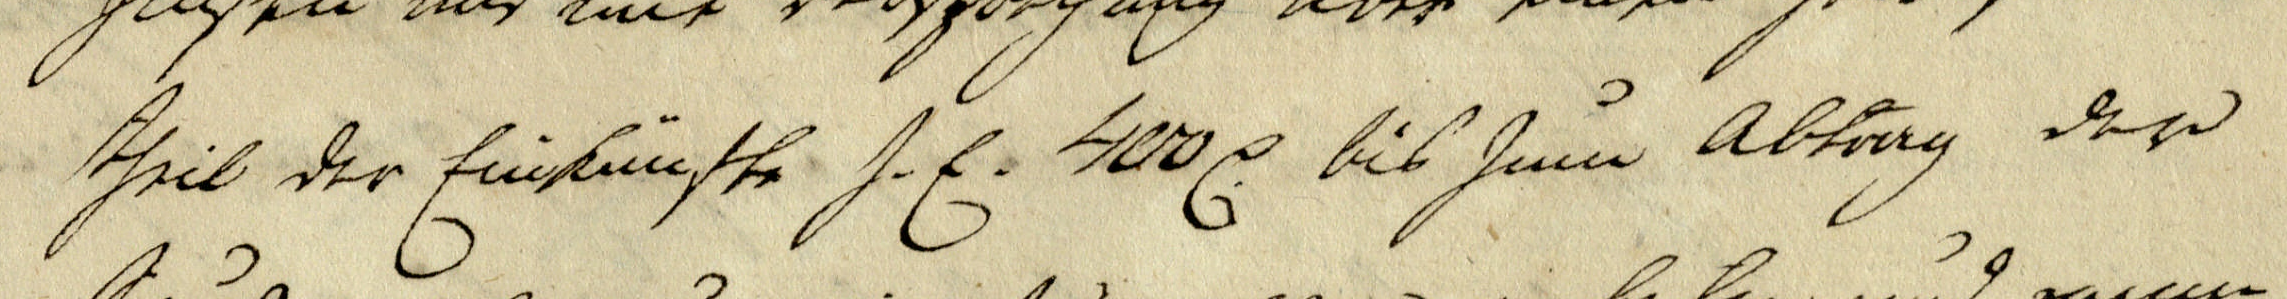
Theil der Einkünfte J. E. 400 l. bis zum Abtrag der
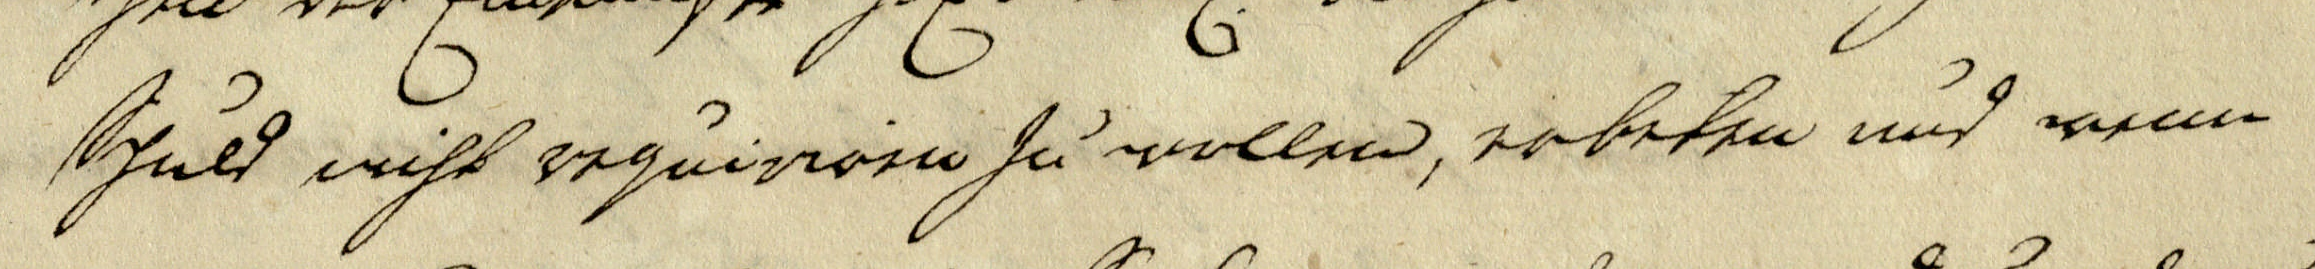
Schuld nicht requiriren zu wollen, erbeten und wenn
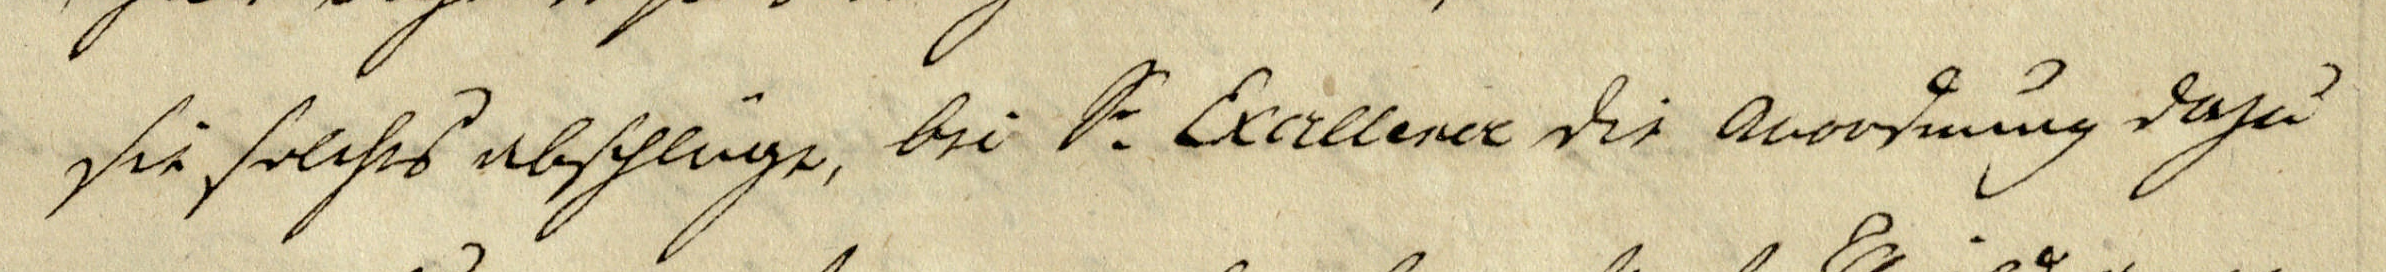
sie solches abschlüge, bei Sr. Excellence die Anordnung dazu
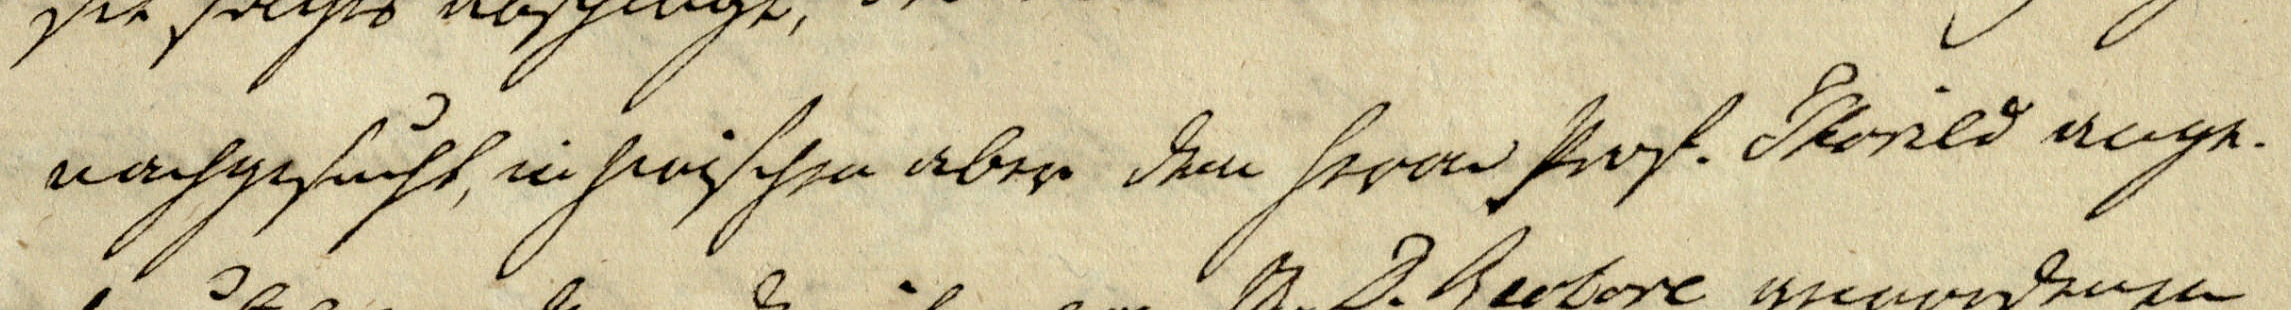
nachgesucht, inzwischen aber dem Herrn Prof. Thorild ange¬
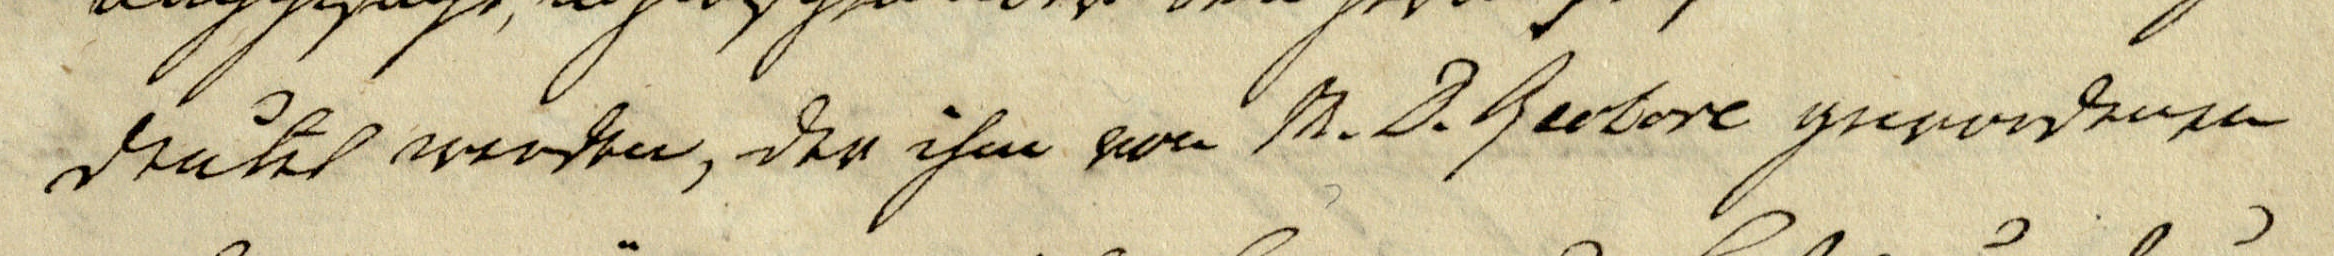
deutet werden, der ihm von M. D. Rectore gewordenen
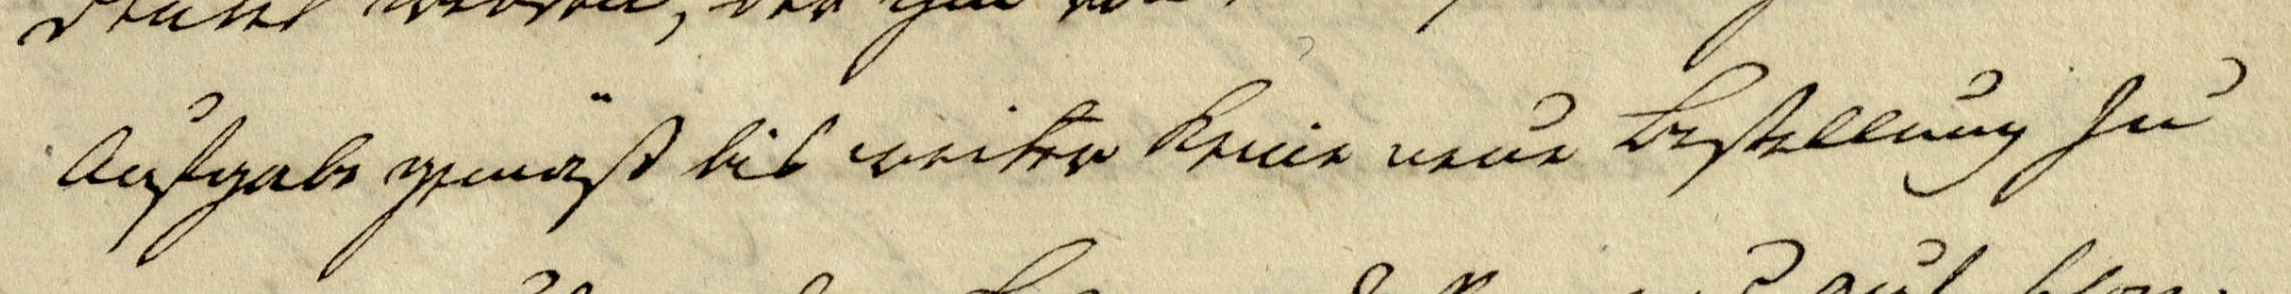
Aufgabe gemäß bis weiter keine neue Bestellung zu
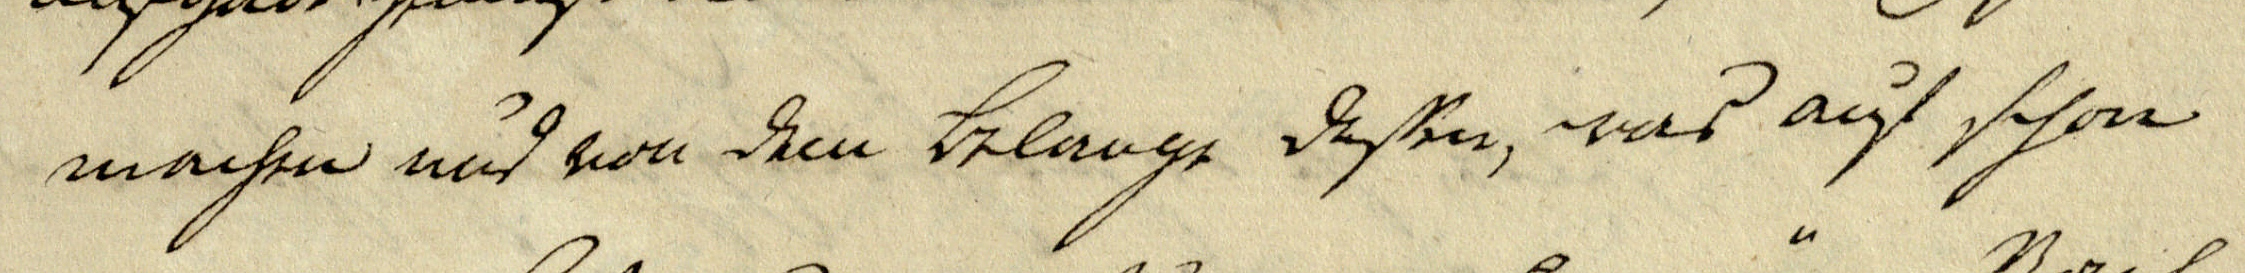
machen und von dem Belange dessen, was auf schon
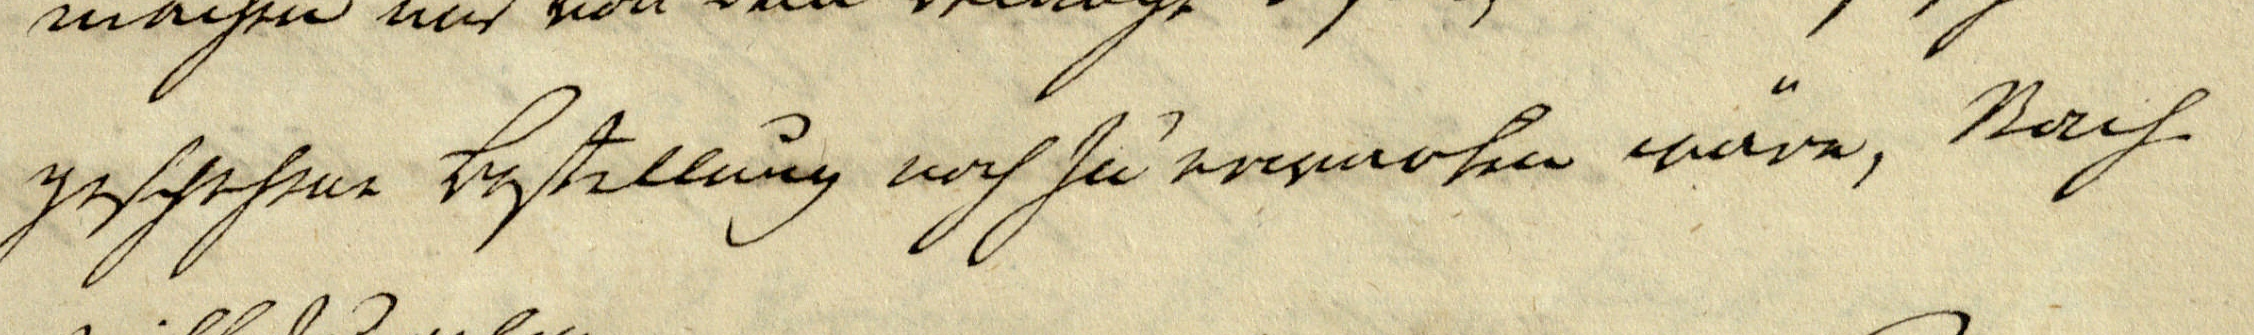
geschehene Bestellung noch zu erwarten wäre, Nach¬
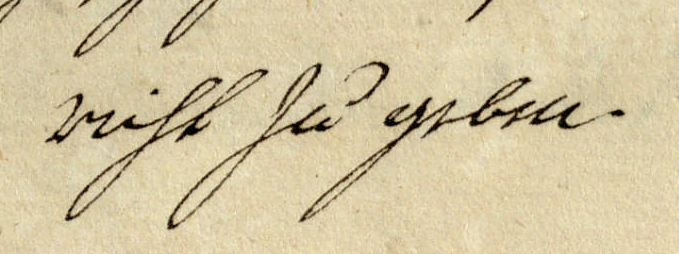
richt zu geben.
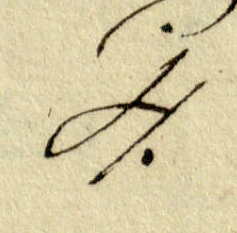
4.
